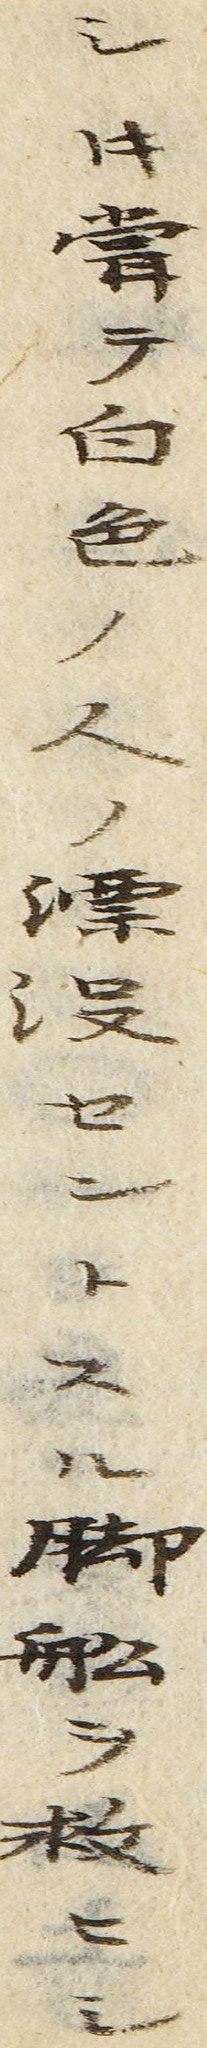シトキ嘗テ白色ノ人ノ漂没セントスル脚船ヲ救ヒシ
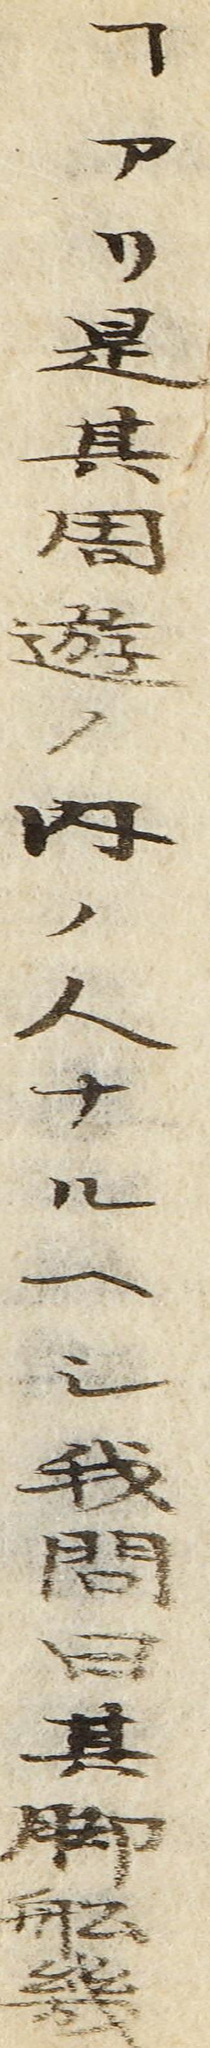コトアリ是其周遊ノ内ノ人ナルヘシ我問曰其脚船幾
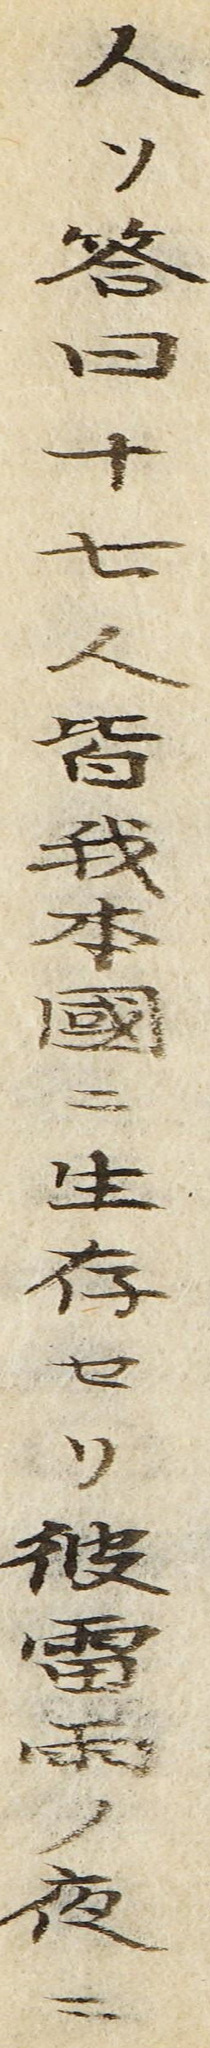人ソ答曰十七人皆我本国ニ生存セリ彼雷雨ノ夜ニ

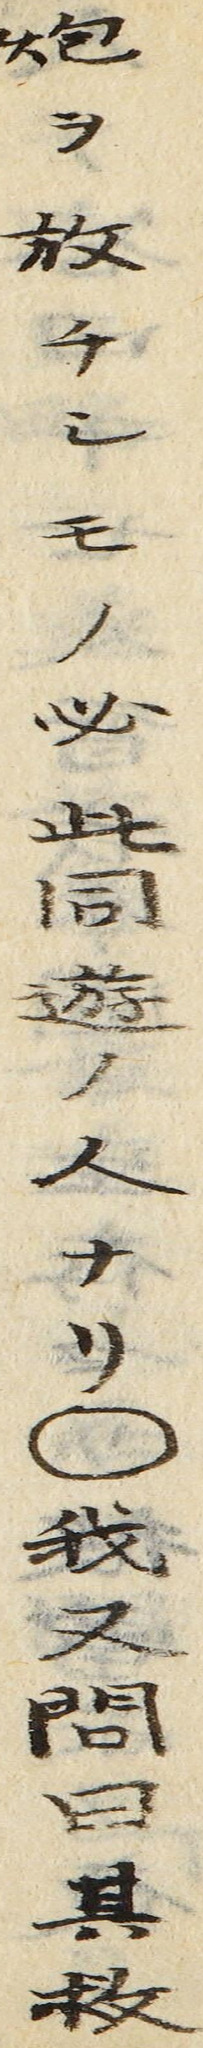炮ヲ放チシモノ必此同遊ノ人ナリ◯我又問曰其救
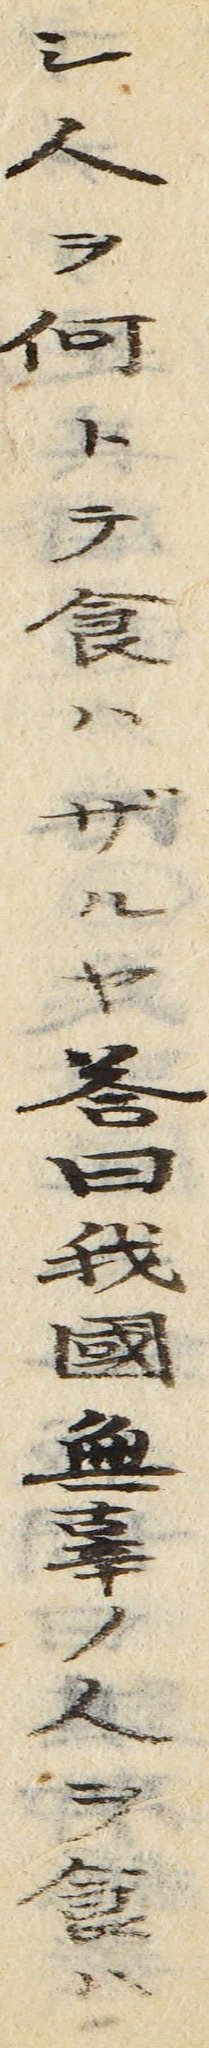シ人ヲ何トテ食ハザルヤ答曰我国無辜ノ人ヲ食ハ
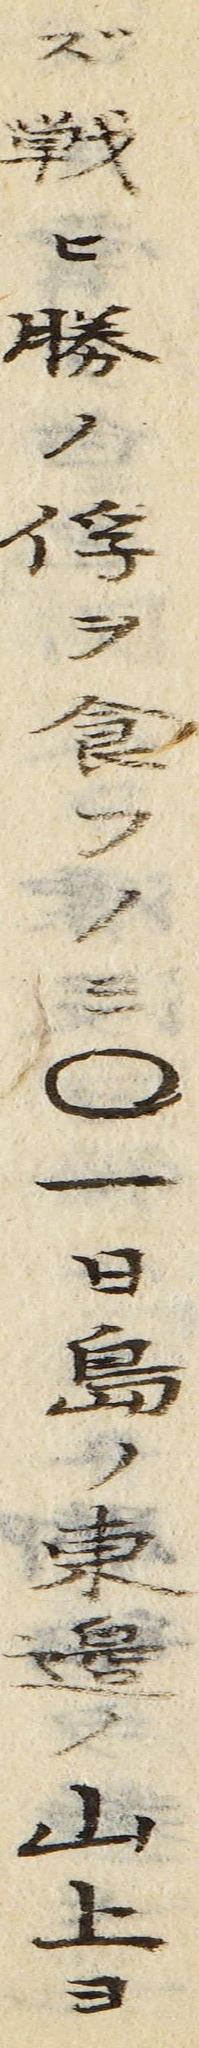ズ戦ヒ勝ノ俘ヲ食フノミ◯一日島ノ東辺ノ山上ヨ
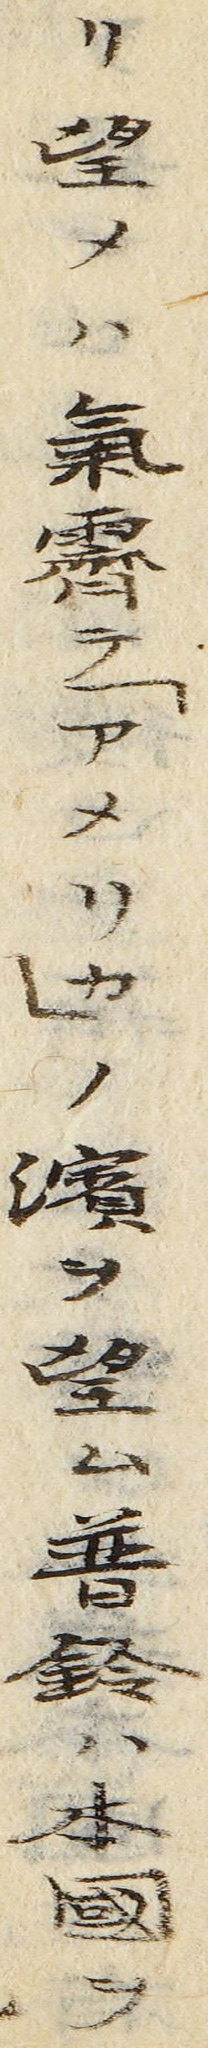リ望メハ気霽テ「アメリカ」ノ浜ヲ望ム普鈴ハ本国ヲ
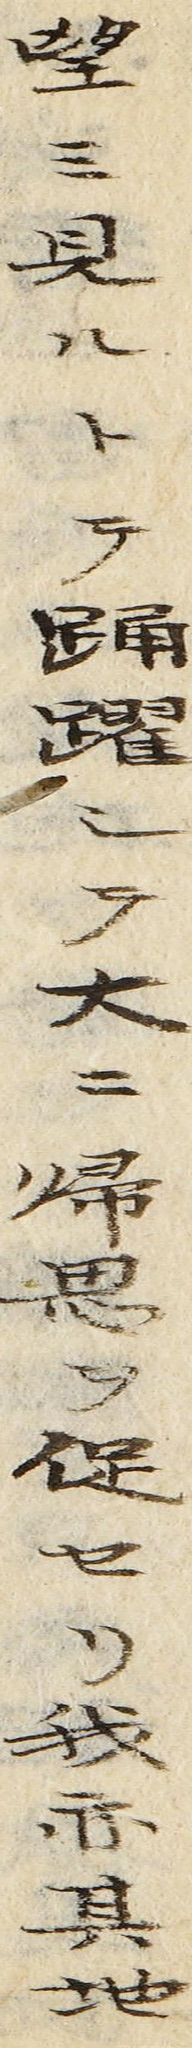望ミ見ルトテ踊躍シテ大ニ帰思ヲ促セリ我亦其地
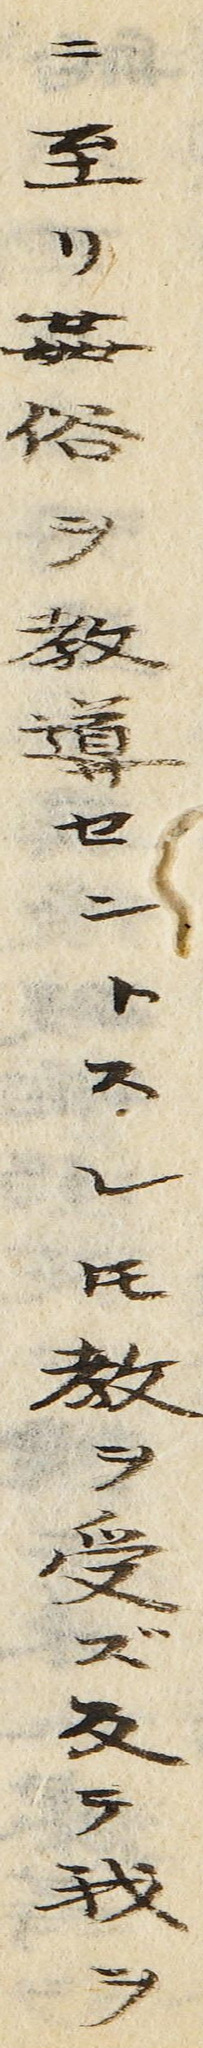ニ至姦俗ヲ教導セントスレトモ教ヲ受ズ反テ我ヲ
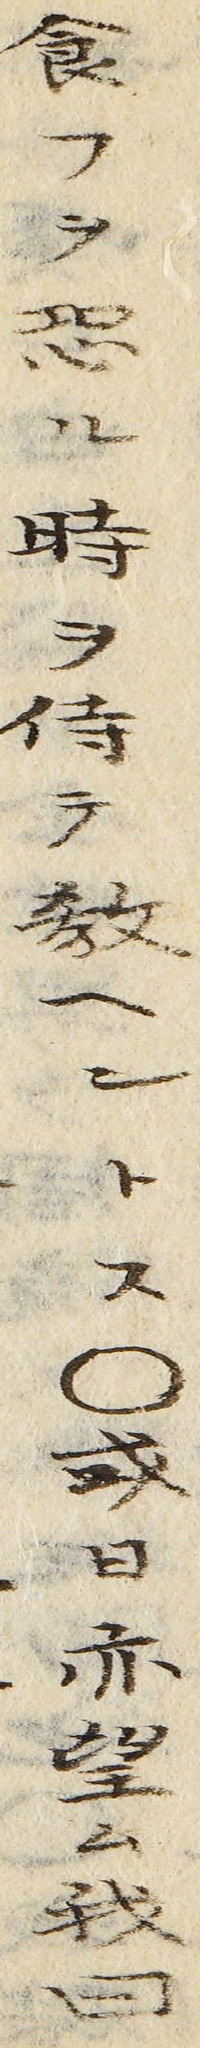食フヲ恐ル時ヲ待テ教ヘントス◯或日亦望ム我曰
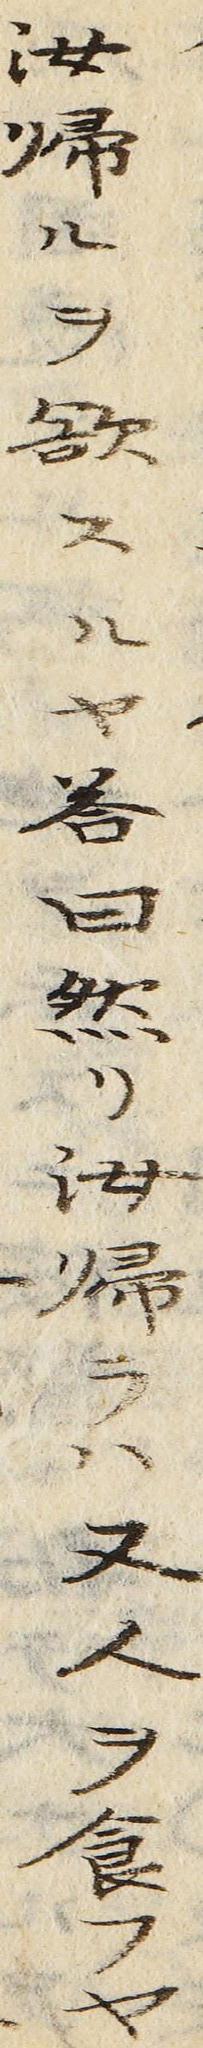汝帰ルヲ欲スルヤ答曰然リ汝帰ラハ又人ヲ食フヤ
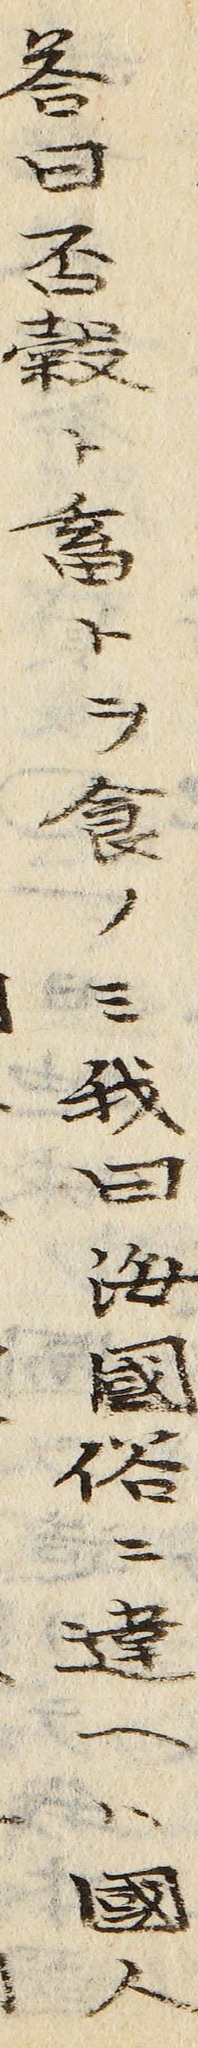答曰否穀ト畜トヲ食ノミ我曰汝国俗ニ違ヘハ国人
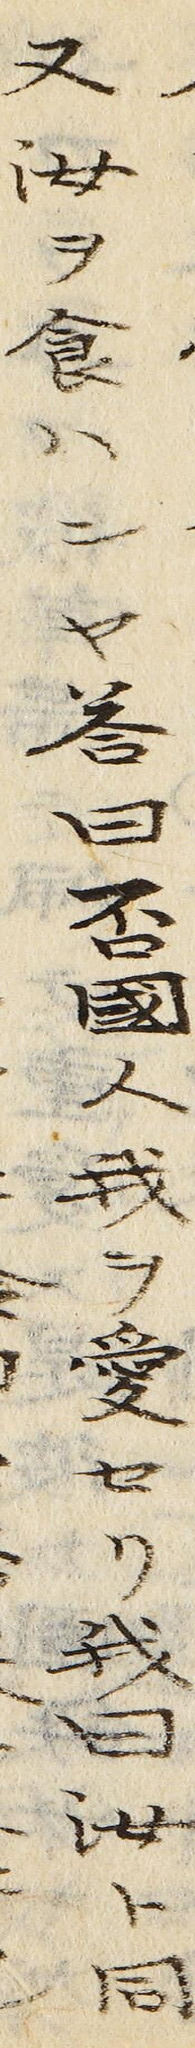又汝ヲ食ハンヤ答曰否国人我ヲ愛セリ我曰汝ト同
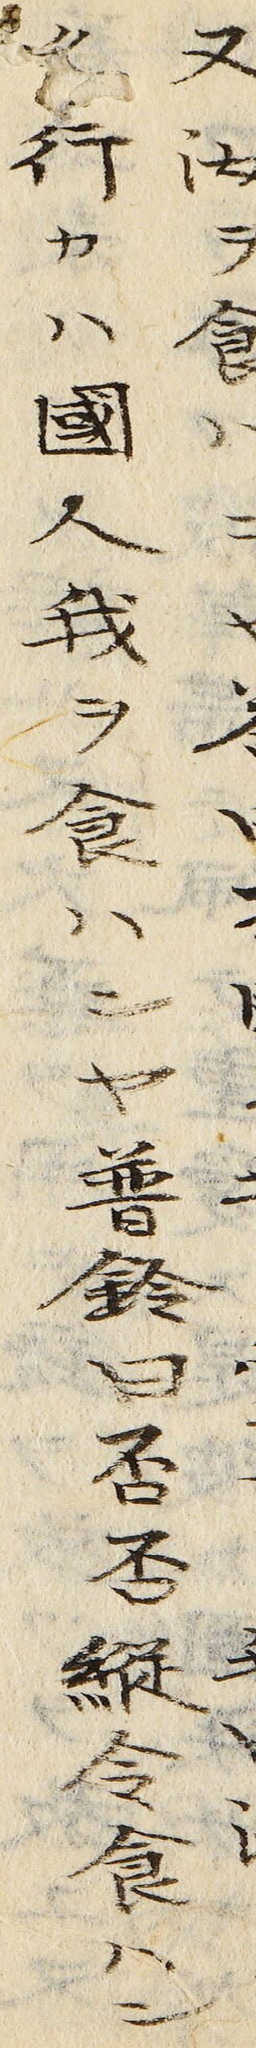ク行カハ国人我ヲ食ハンヤ普鈴曰否否縦令食ハン
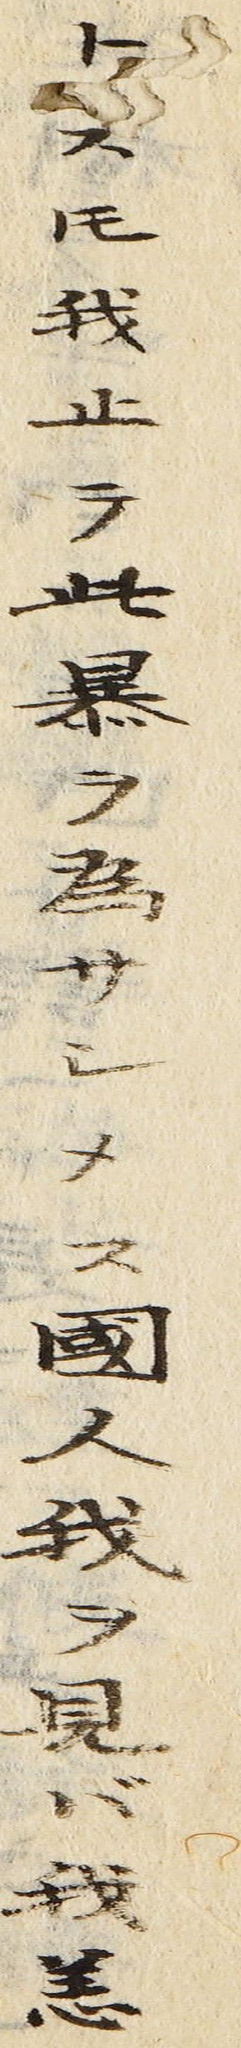トストモ我止テ此暴ヲ為サシメス国人我ヲ見バ我恙
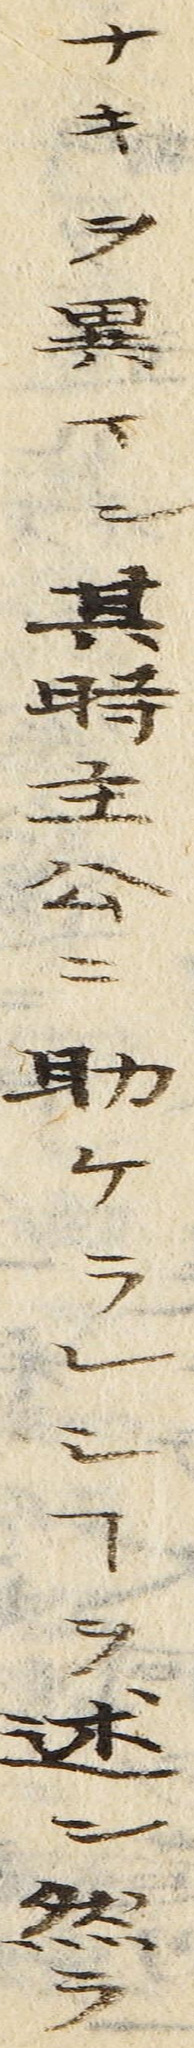ナキヲ異マン其時主公ニ助ケラレシコトヲ述ン然ラ
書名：漂流紀事
